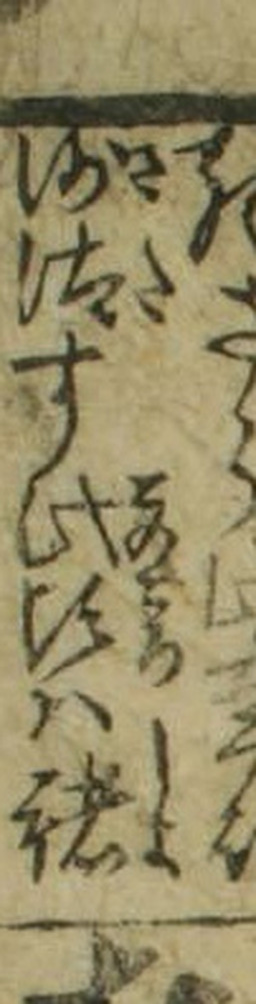沙汰す此頃は諸

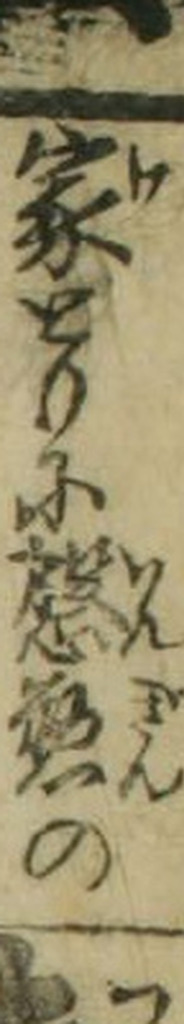家ともに慇懃の
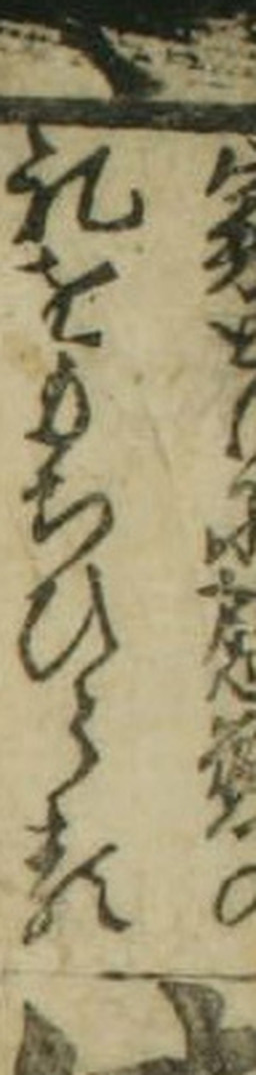礼をもちひらる
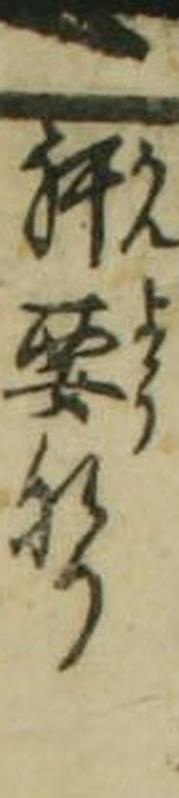肝要なり
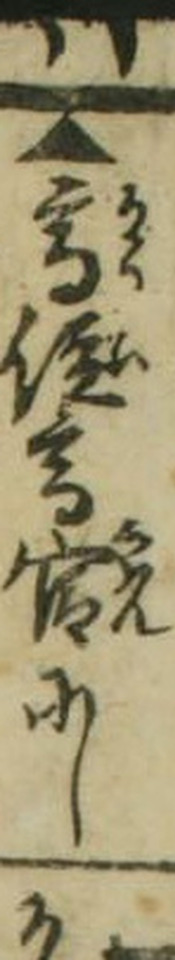▲高位高官にし
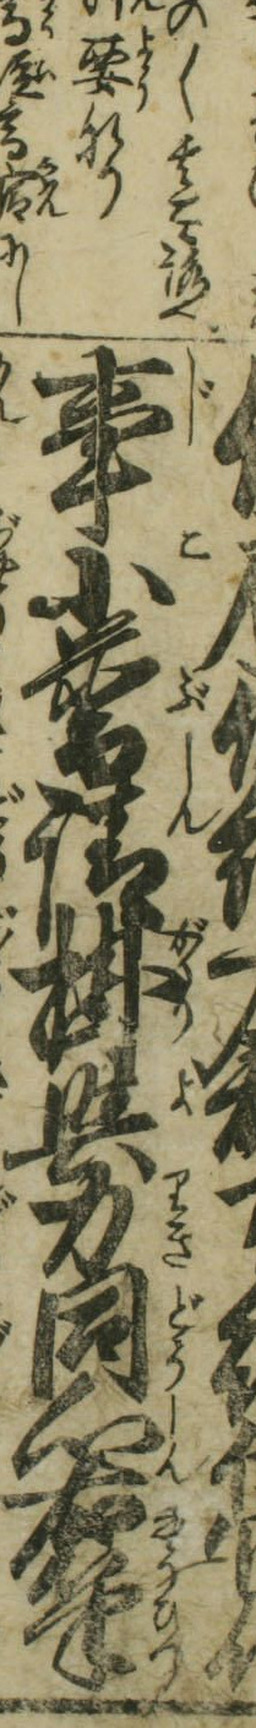亊小普請掛与力同心祐筆
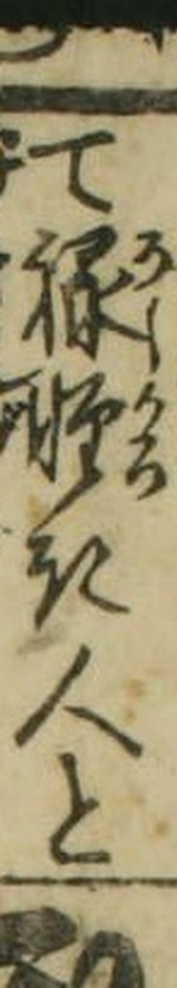て禄軽き人と
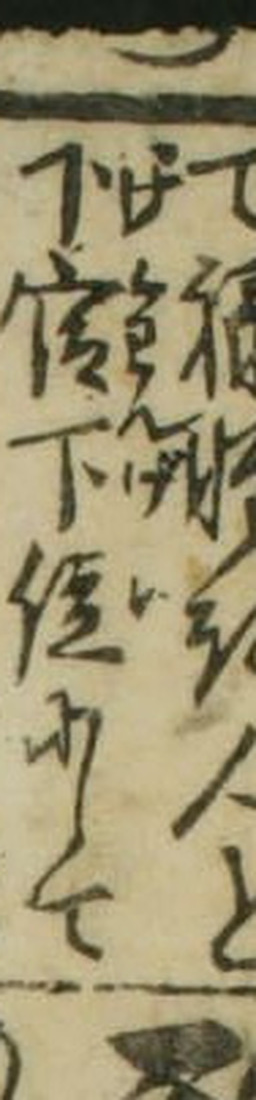下官下位にして
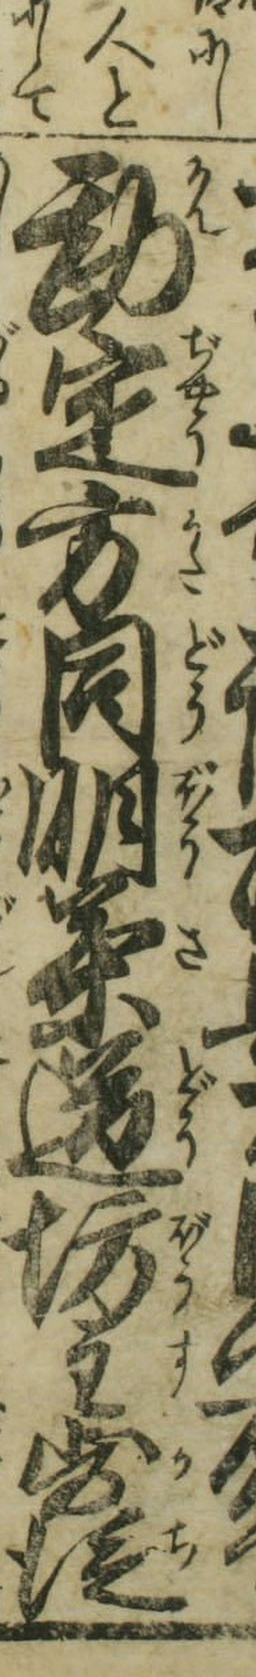勘定方同朋茶道坊主歩徒
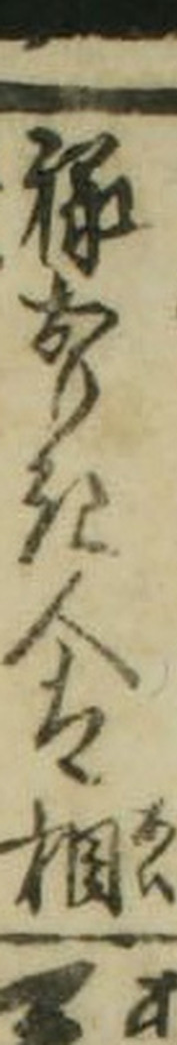禄おもき人は相
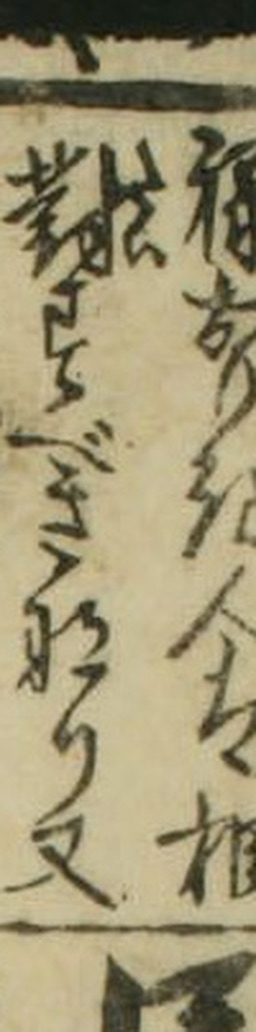対すべきなり又
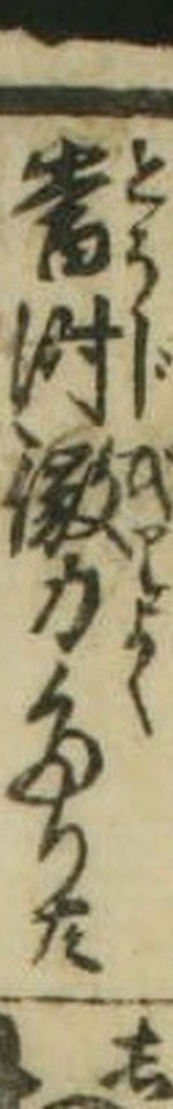当時微力たり共
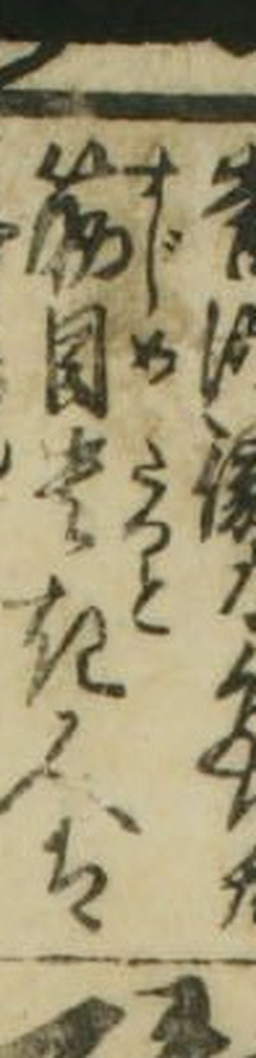筋目貴き人は
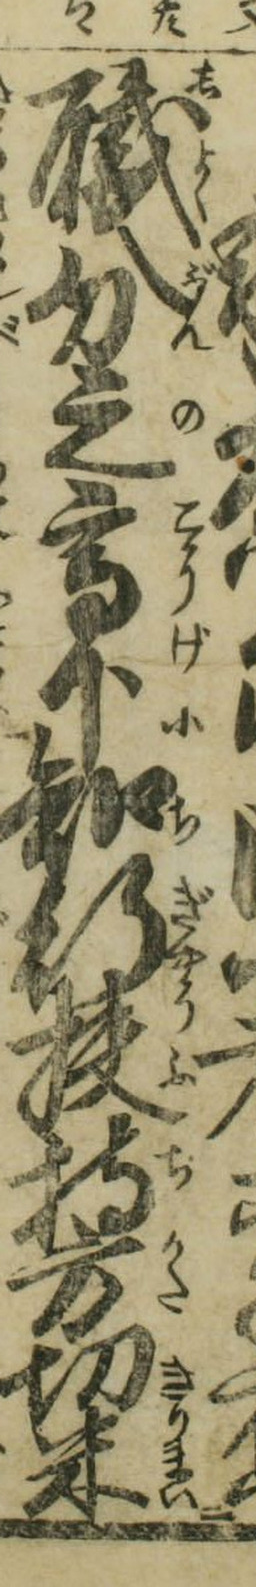職分之高下知行扶持方切米
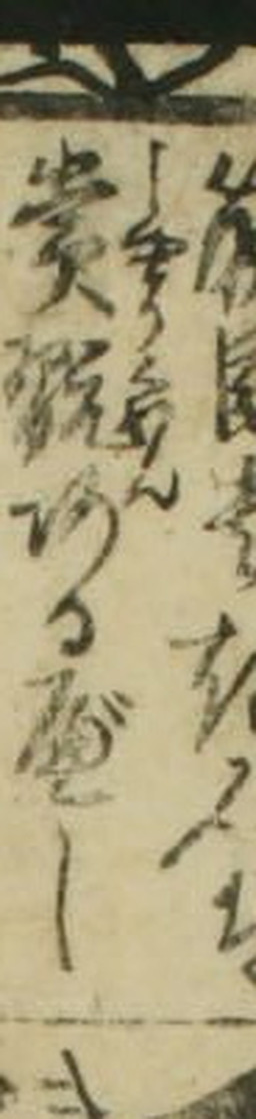賞翫あるべし
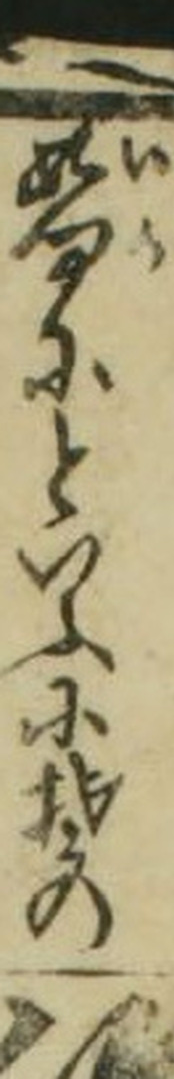如何にといふにその
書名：増補職人往来
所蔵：東京学芸大学教育コンテンツアーカイブ
